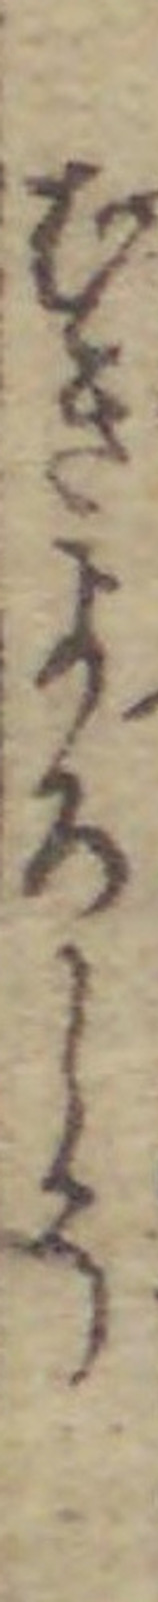むきよろしう

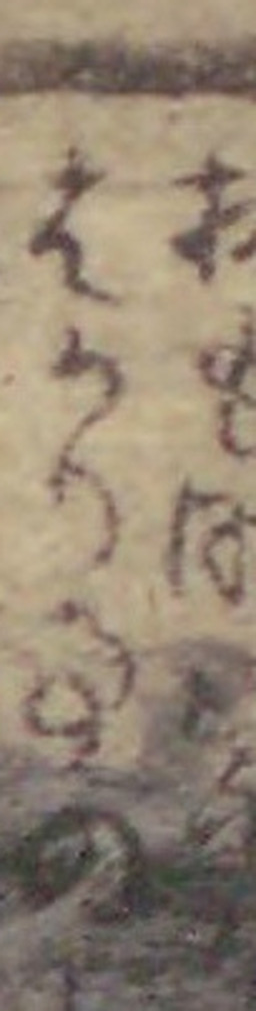はかり事の
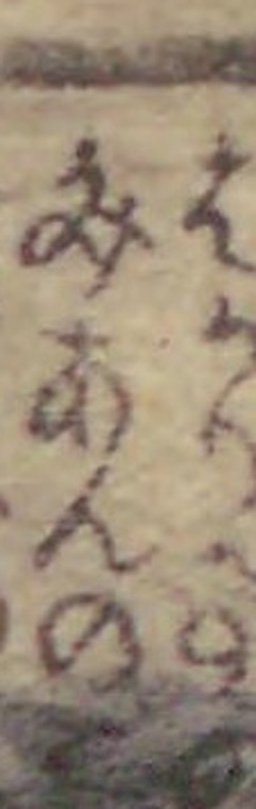文あんのこ
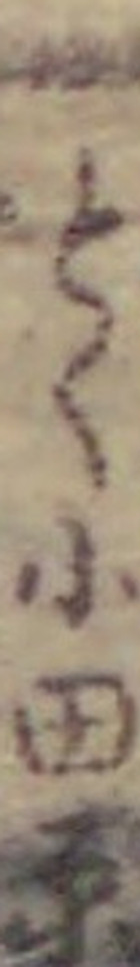とく小田原
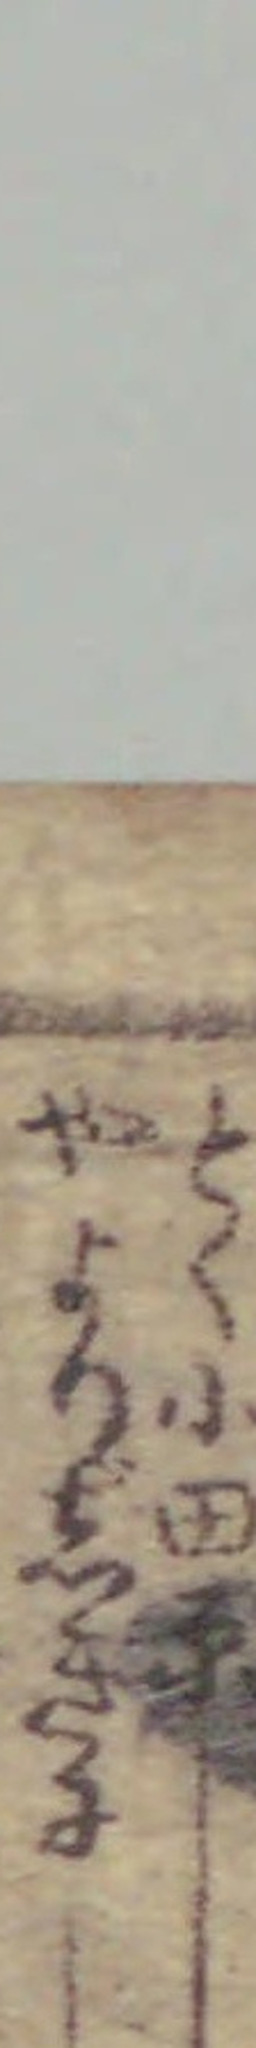やよりじきに
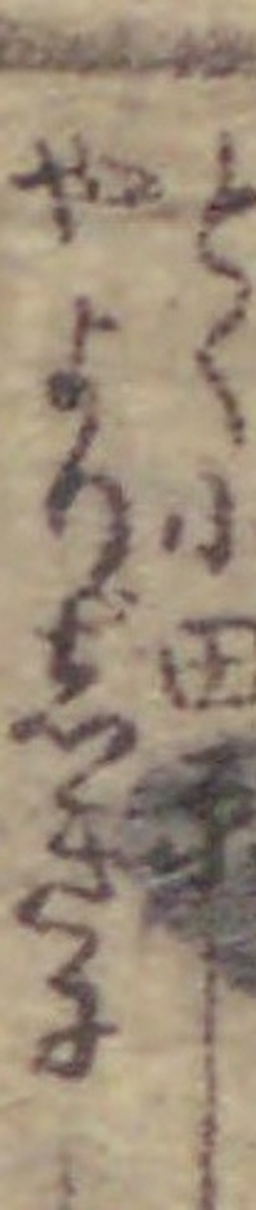やよりじきに
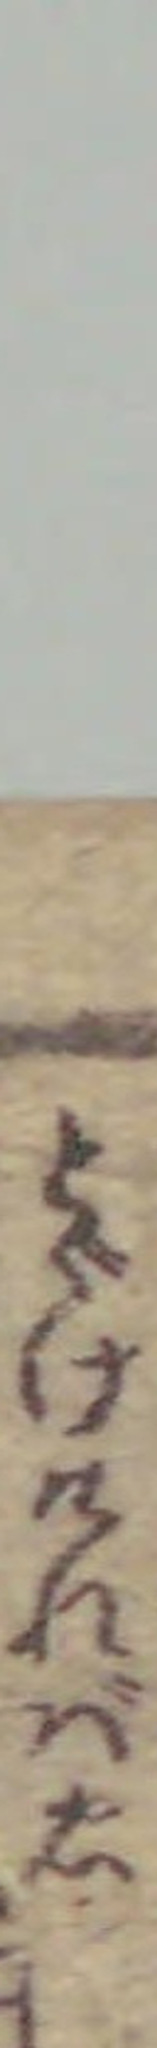とゞけければ忠
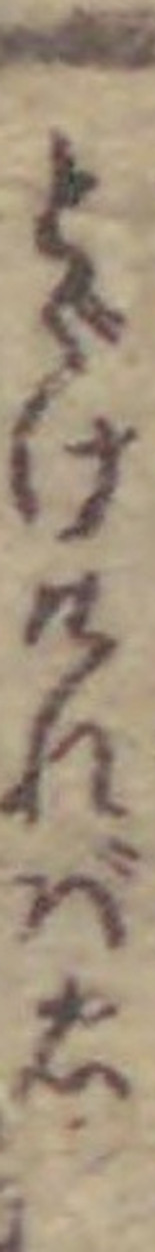とゞけければ忠
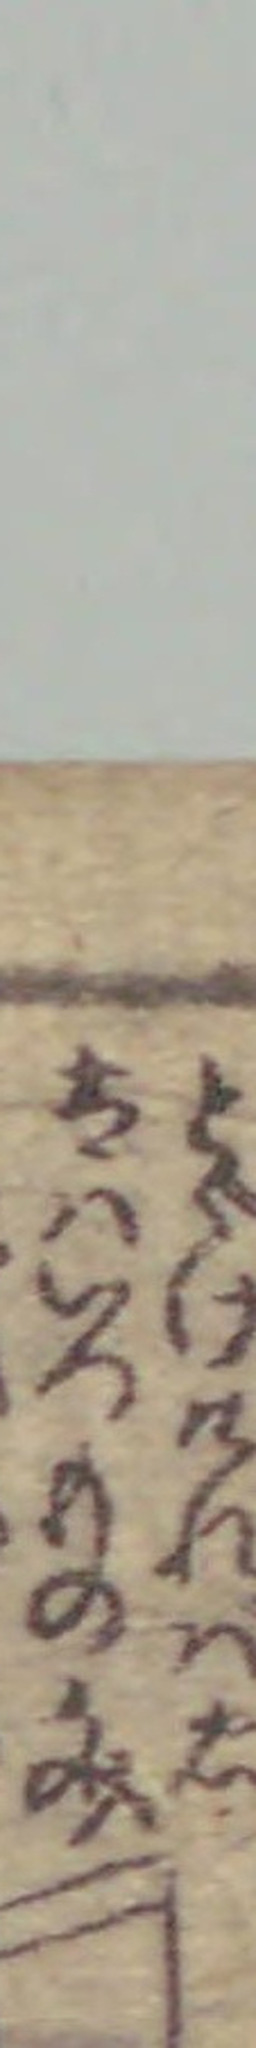太はいつもの文
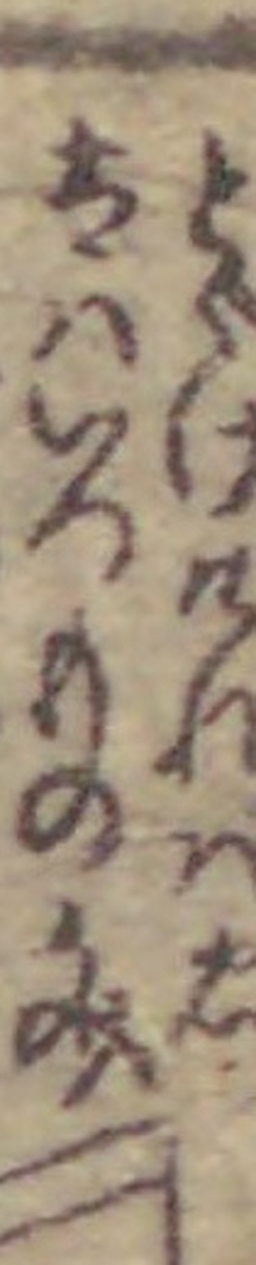太はいつもの文
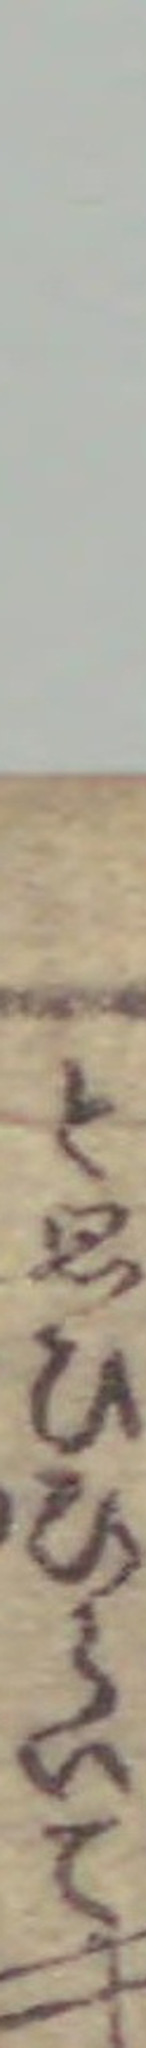と思ひひらいて
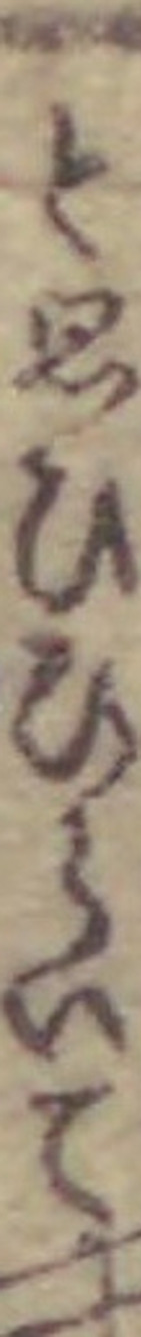と思ひひらいて
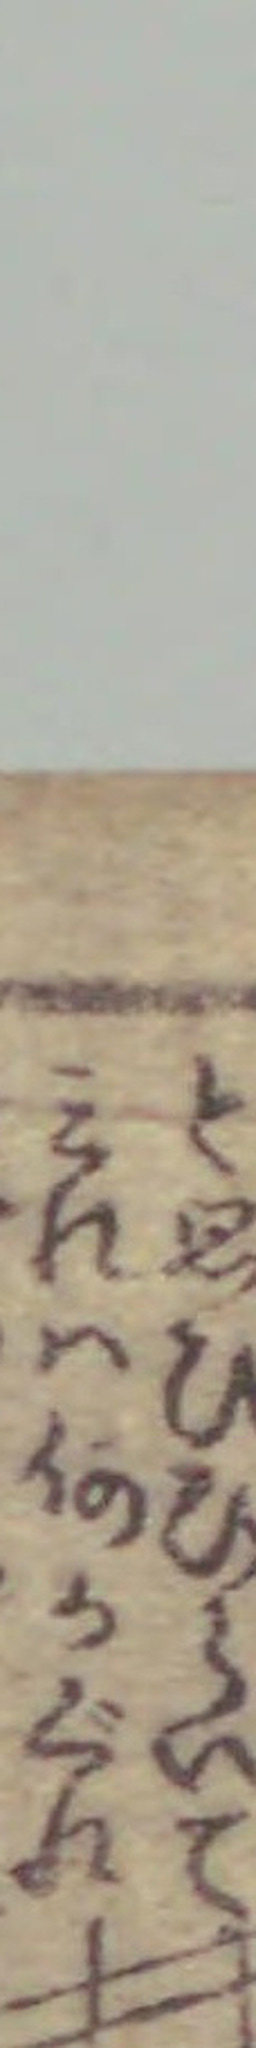みれは何かぐれ
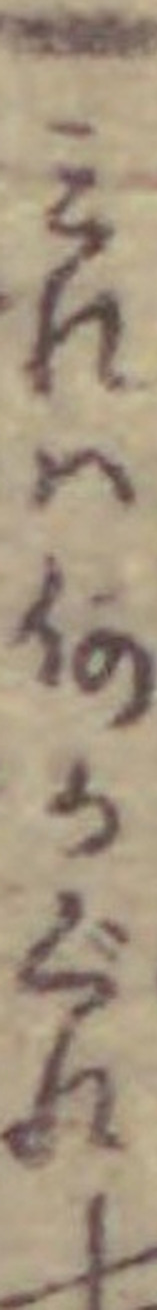みれは何かぐれ
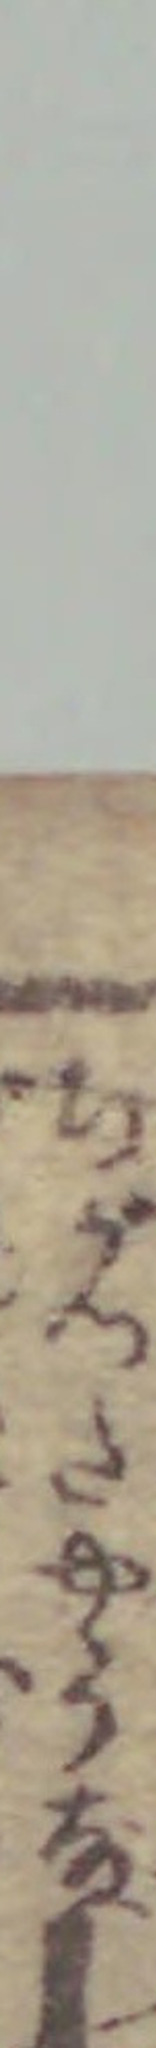ちがつたやう故
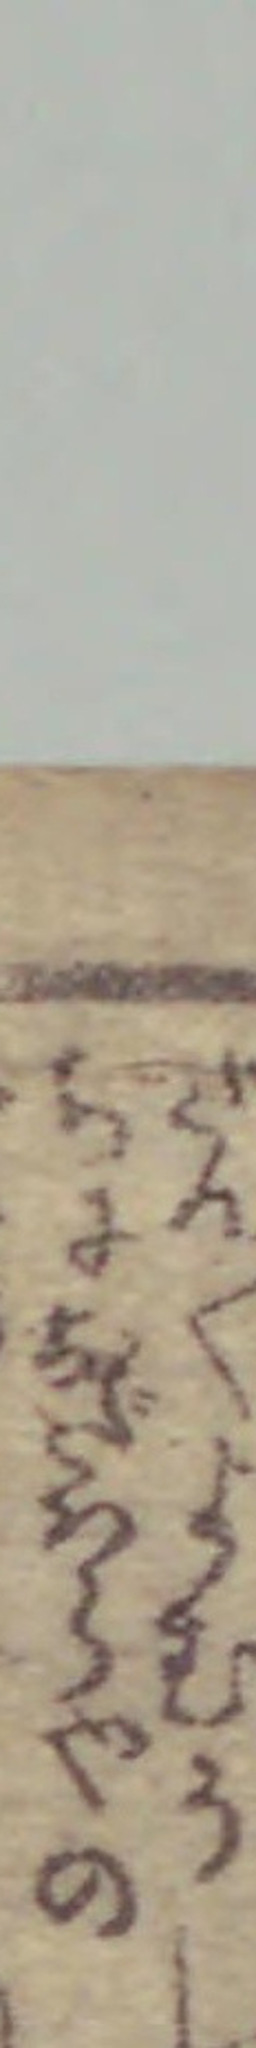ちにおだはらやの
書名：間似合嘘言曽我 3巻
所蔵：国立国会図書館 National Diet Library, JAPAN
